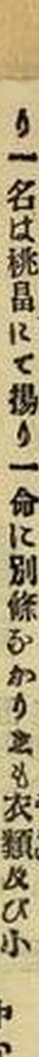り一名は桃畠にて揚り一命に別條なかりしも衣類及び小
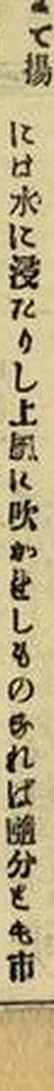には水に浸たりし上風に吹かれしものなれば随分とも市
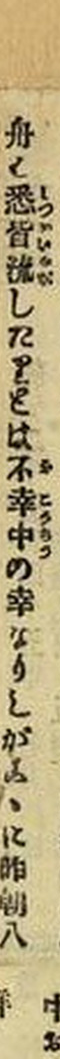舟は悉皆流したりとは不幸中の幸いなりしがこゝに昨朝八
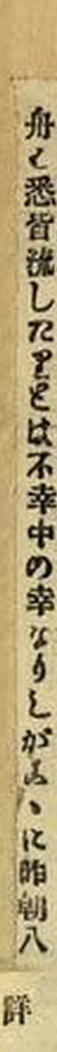舟は悉皆流したりとは不幸中の幸いなりしがこゝに昨朝八
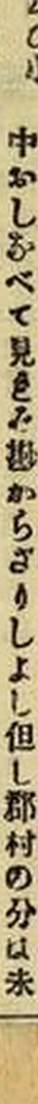中おしなべて見れは尠からざりしよし但し郡村の分は未
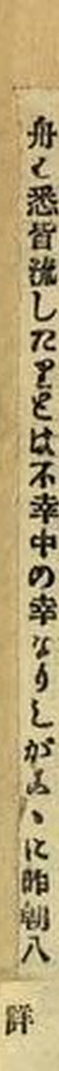舟は悉皆流したりとは不幸中の幸いなりしがこゝに昨朝八
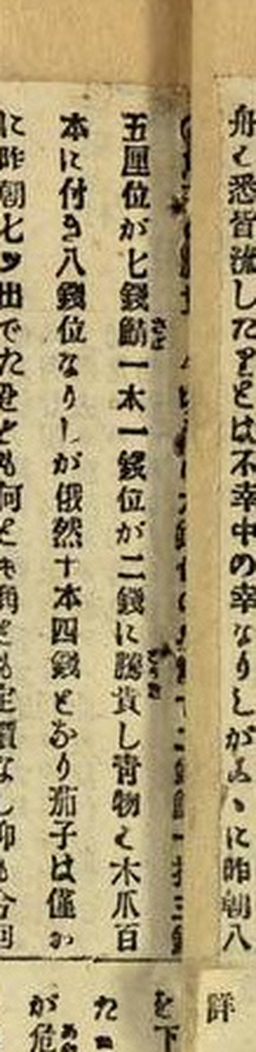五厘位が七錢鯖一本一銭位が二銭に騰貴し靑物は木瓜百
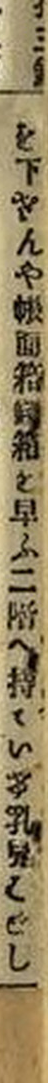を下さんや帳面籍同箱と早ふ二階へ持ていけ乳兒はどし
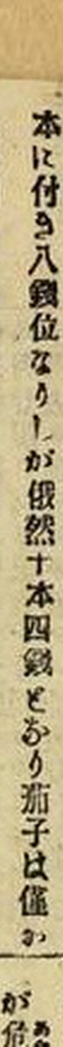本に付八銭位なりしが俄然十本四銭となり茄子は僅か
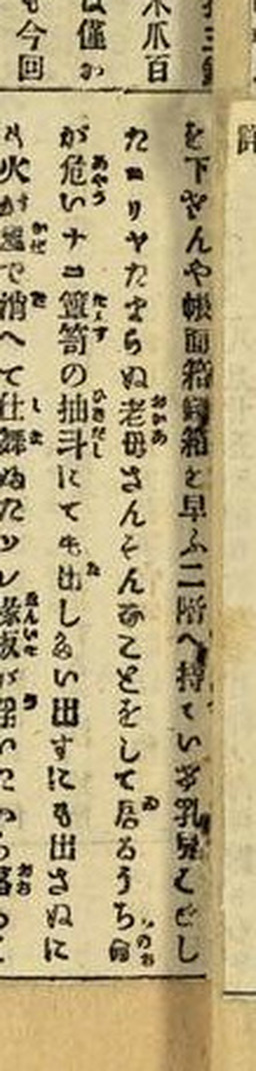たニリヤたまらぬ老母さんそんなことをして居るうち命
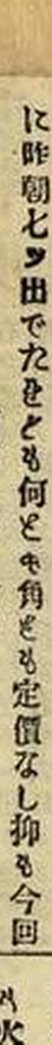に昨朝七ッ出でたれとも何とも角とも定價なし抑も今回
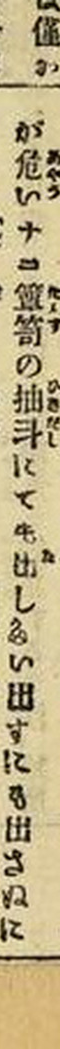が危いナニ箪笥の抽斗にても出したい出すにも出さぬに
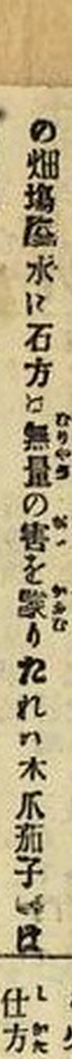の畑塲溢水に石方は無量の害を蒙りたれは木瓜茄子等は
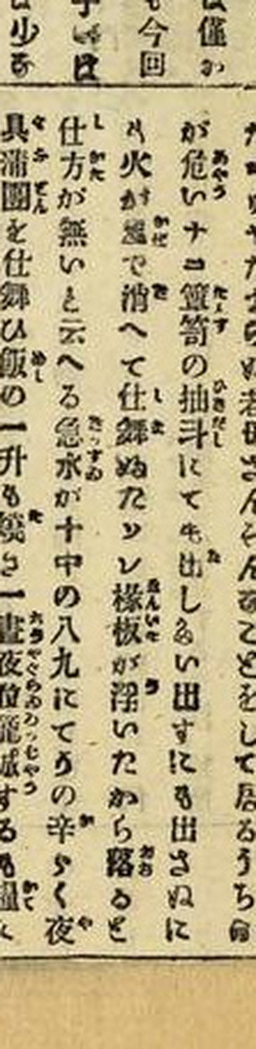も火が風で消へて仕舞ふたソレ椽板が浮いたから落ると
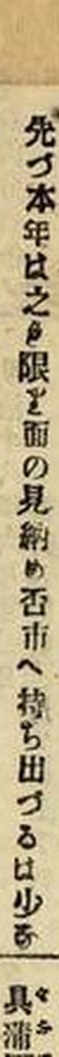先づ本年は之れ限り面の見納め否市へ持ち出づるは少な
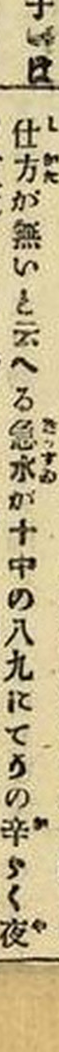仕方が無いと云へる急水が十中の八九にてかの辛らく夜
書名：温古集 五巻
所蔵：福井県文書館 Fukui Prefectural Archives
